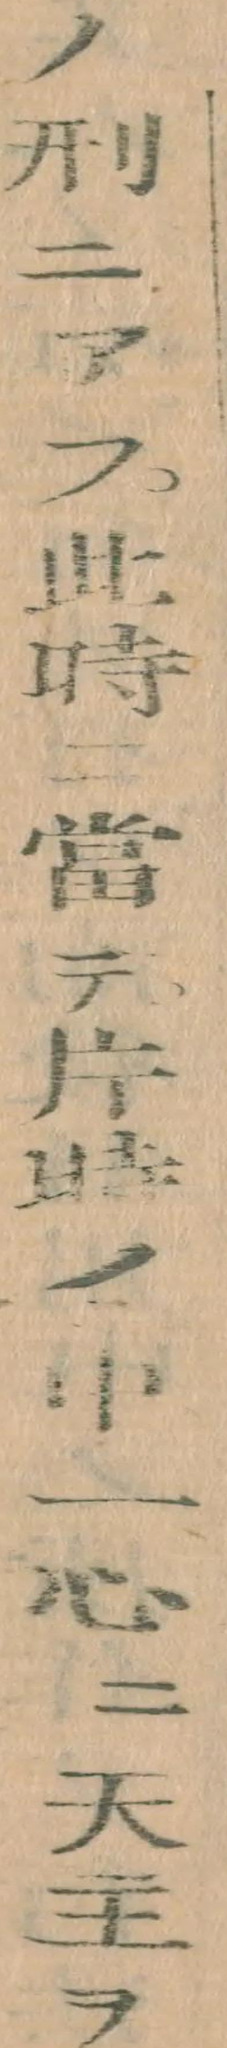ノ刑ニアフ。此時ニ当テ。片時ノ中一心ニ天主ヲ
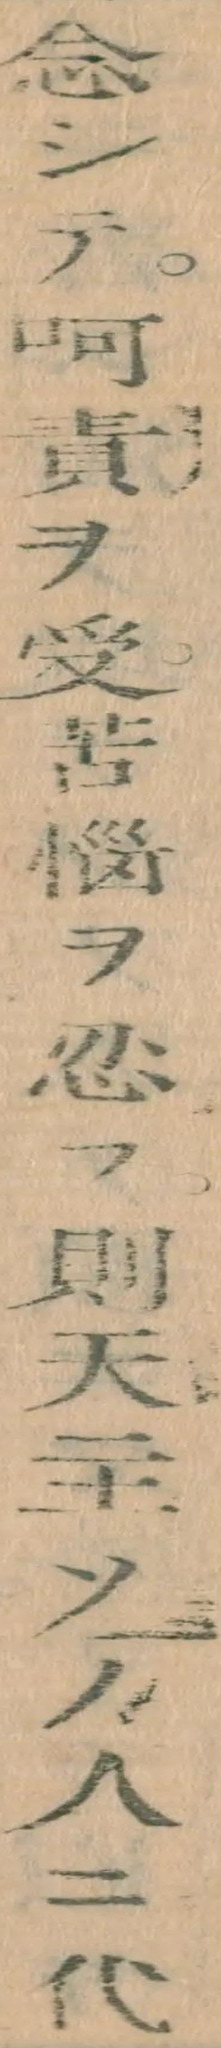念シテ。呵責ヲ受。苦悩ヲ忍フ。則天主ソノ人ニ代
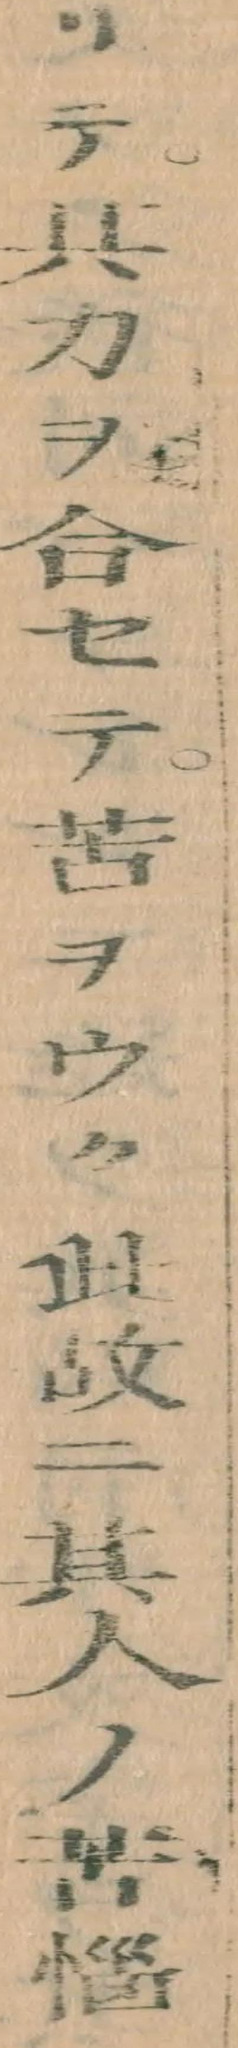リテ。其力ヲ合セテ。苦ヲウク此故ニ其人ノ苦悩
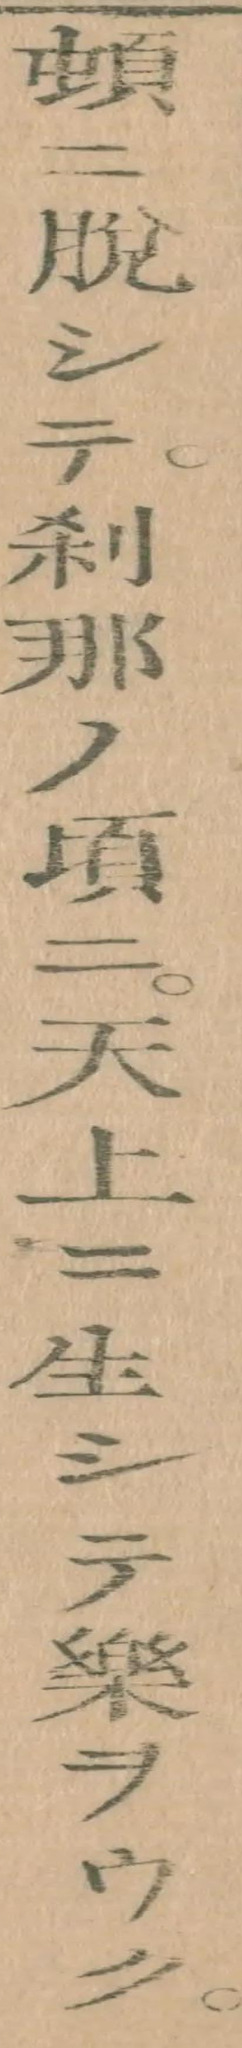頓ニ脱シテ。刹那ノ頃ニ。天上ニ生シテ楽ヲウク。
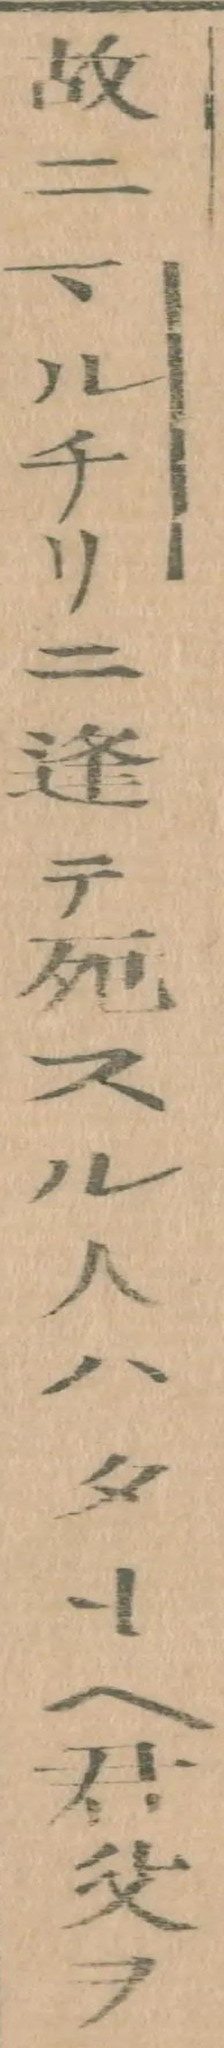故ニマルチリニ逢テ死スル人ハタトヘ君父ヲ
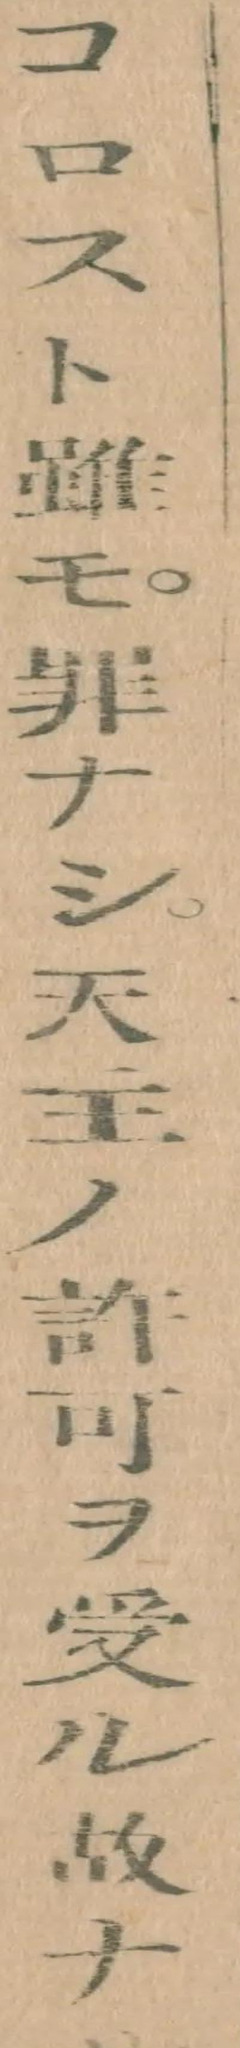コロスト雖モ。罪ナシ。天主ノ許可ヲ受ル故ナリ
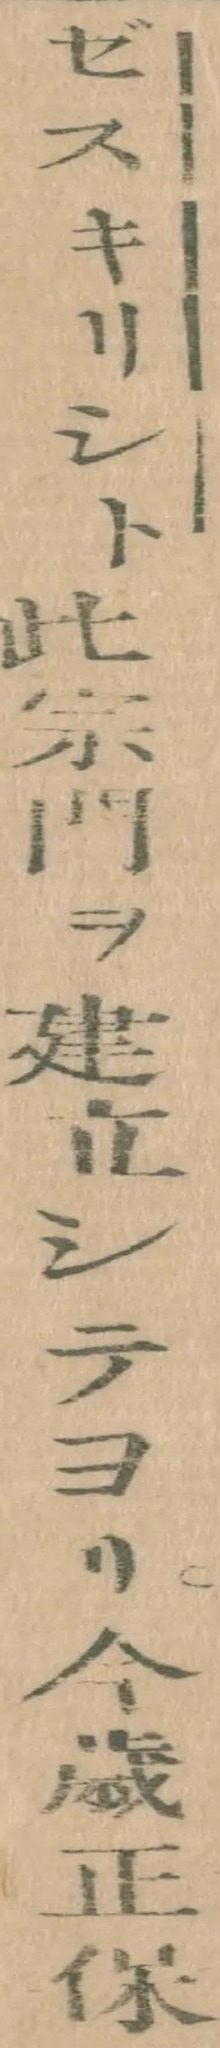ゼスキリシト此宗門ニ建立シテヨリ。今歳正保
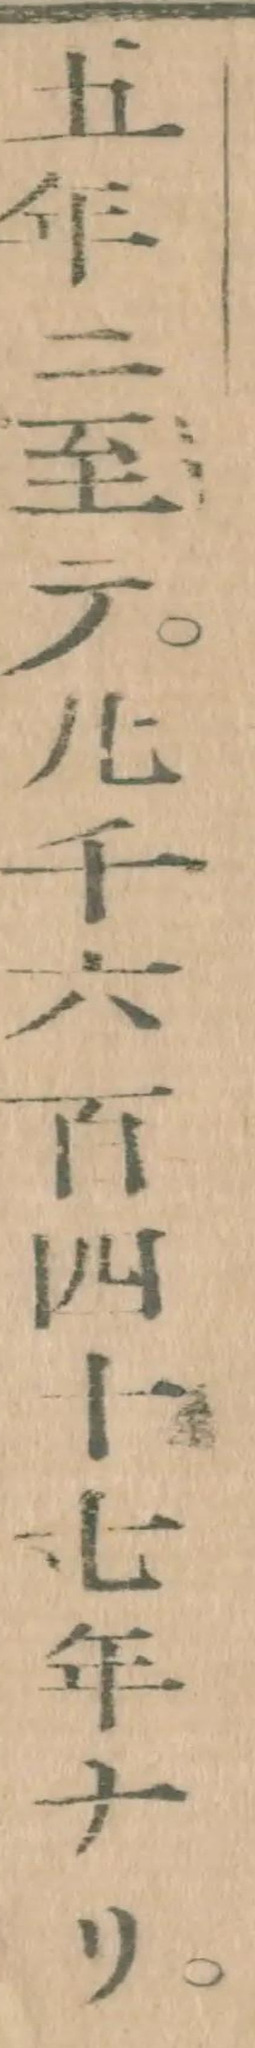五年ニ至テ。凡千六百四十七年ナリ。
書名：南蛮寺興廃記
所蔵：国立国会図書館 National Diet Library, JAPAN
